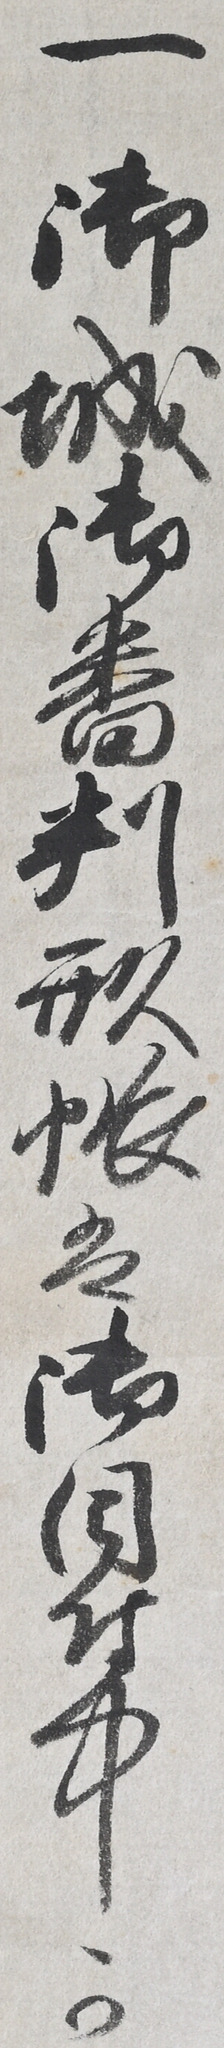一御城御番判形帳は御目付中可
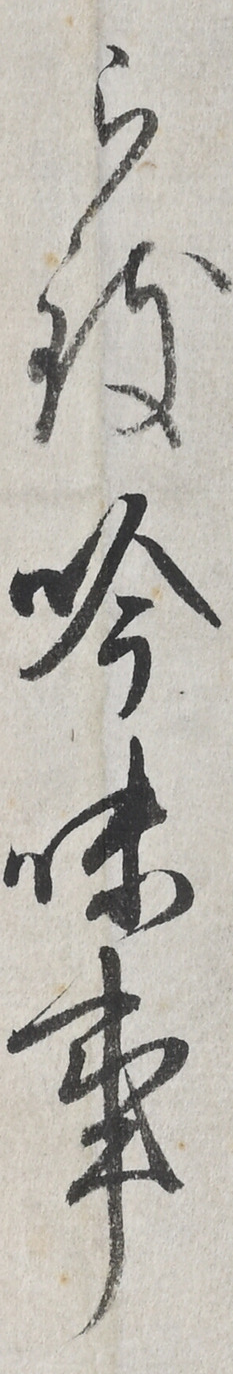被致吟味事
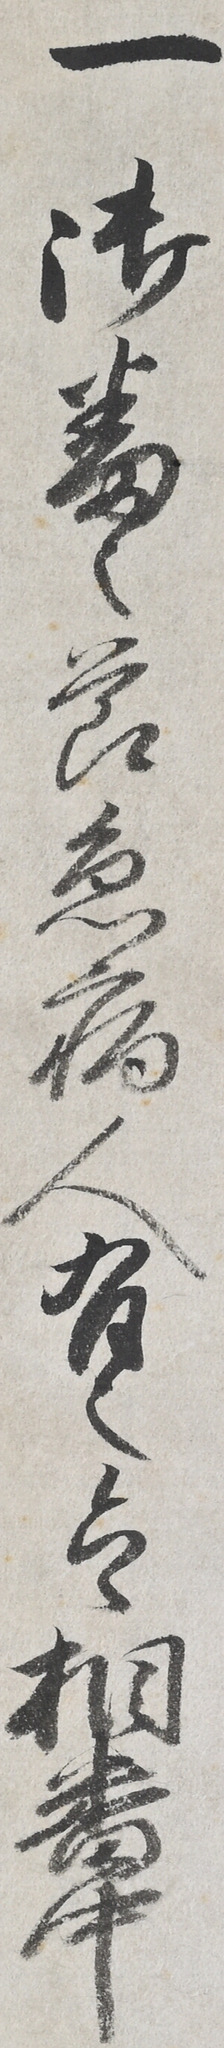一御番之節急病人有之候ハヽ相番中
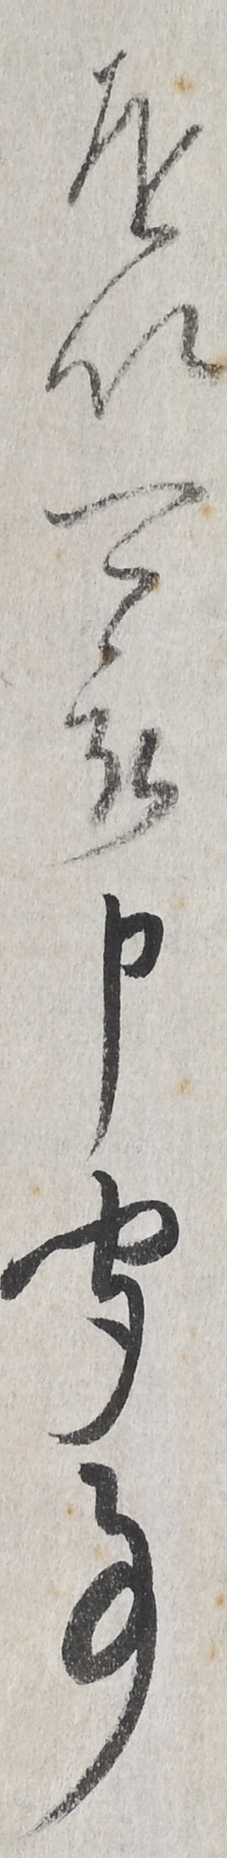を以可被申聞事
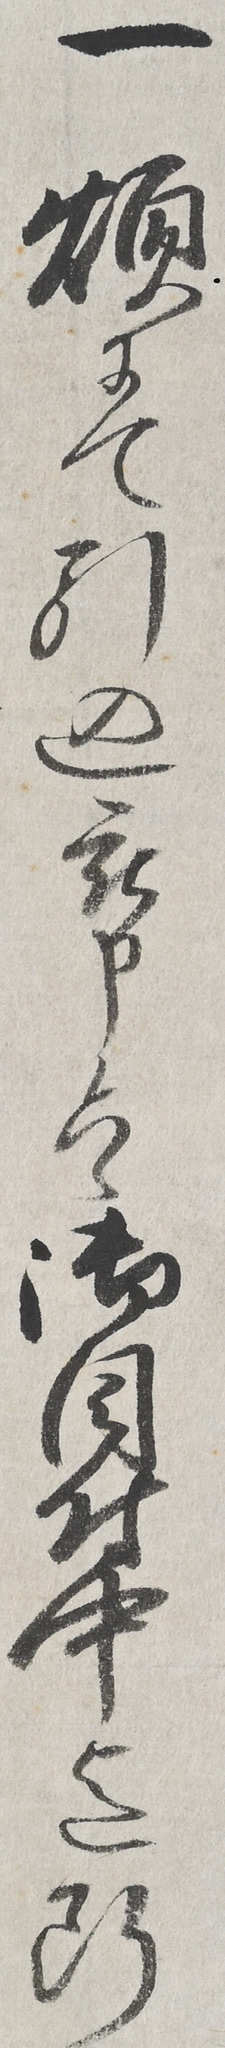一煩にて引込被申候ハヽ御目付中迄断
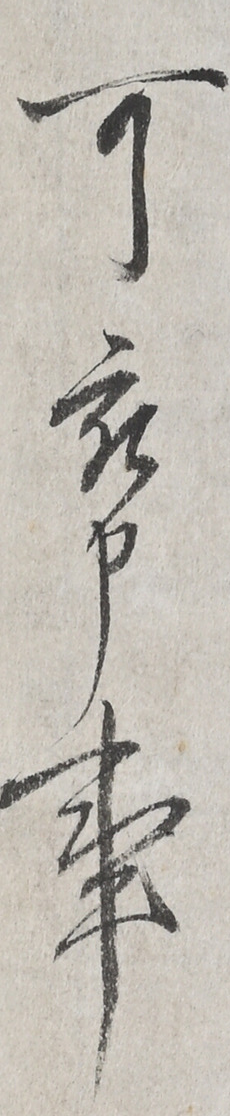可被申事
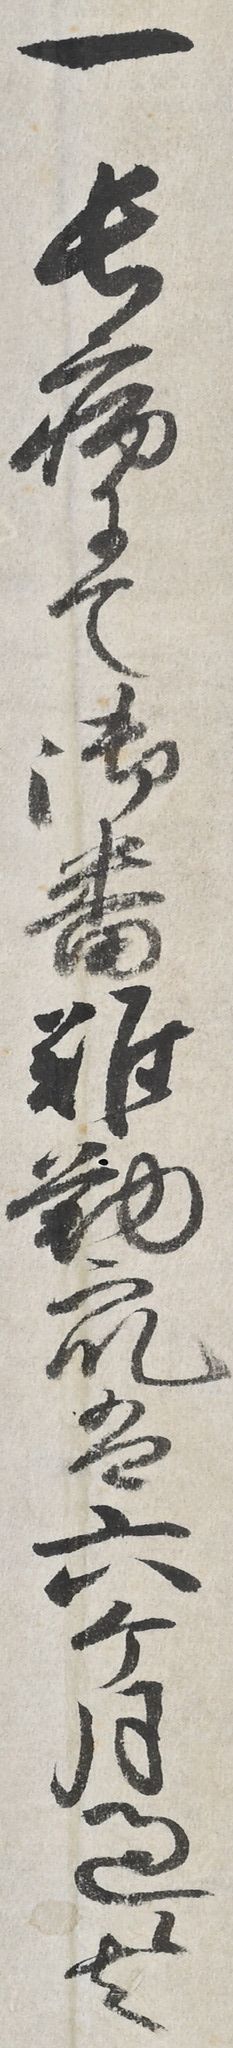一長病にて御番難勤衆は六ヶ月過ニ者
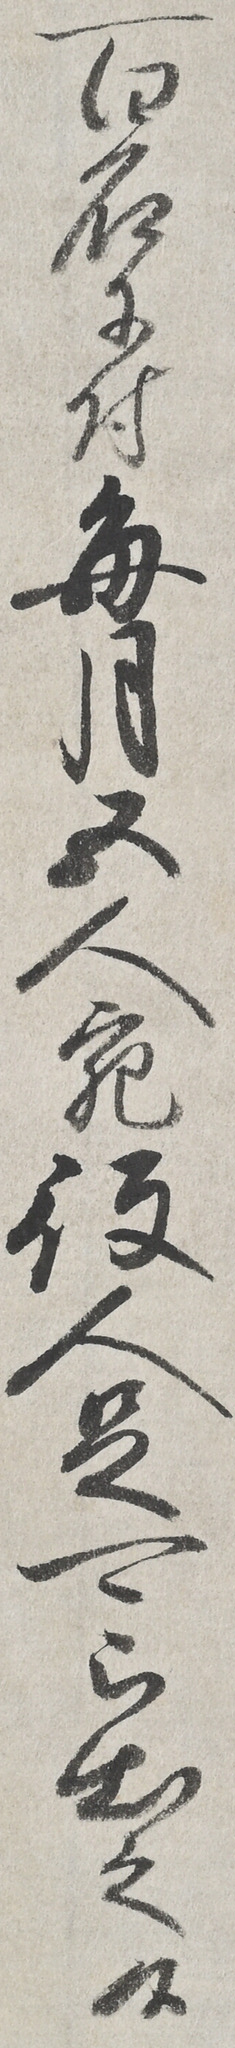百石に付毎月五人宛役人足可被出之候
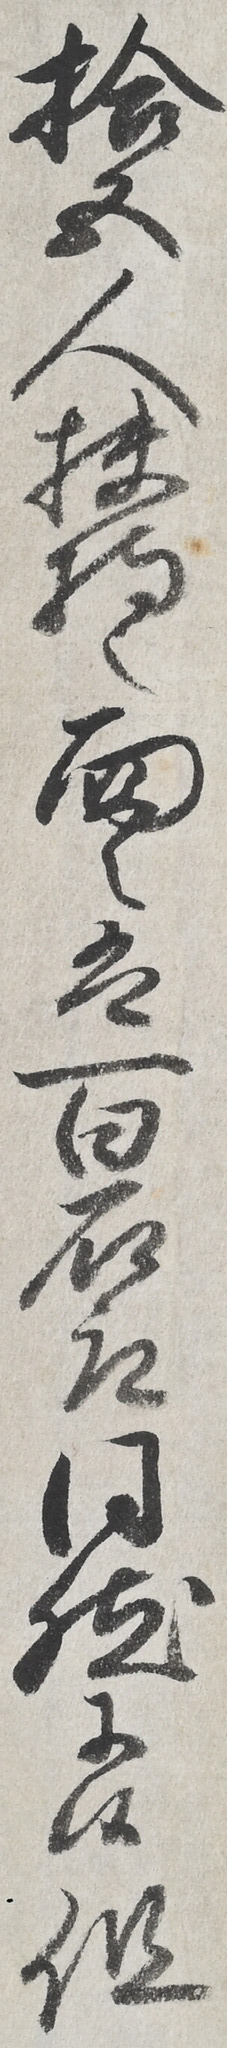拾五人扶持之面々は百石取同然に候但
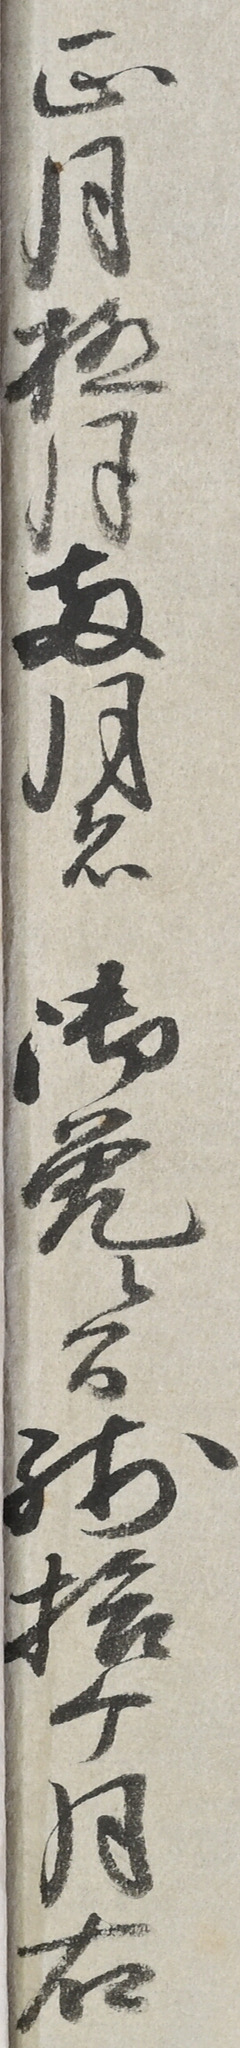正月極月両月者御免候間残拾ヶ月右

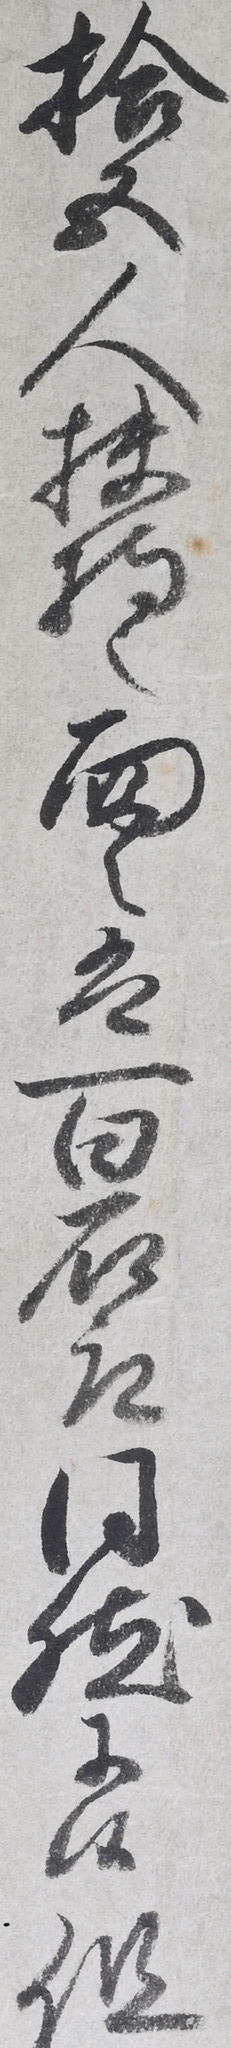拾五人扶持之面々は百石取同然に候但
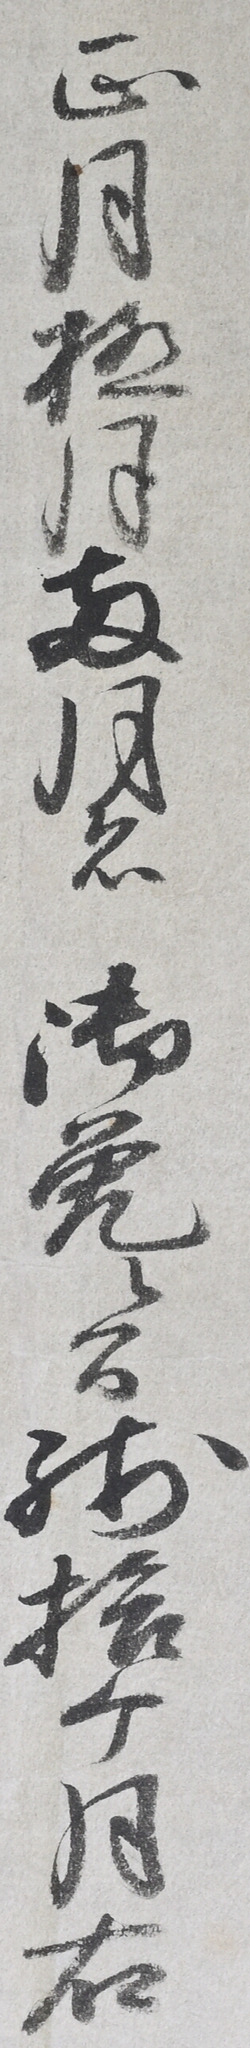正月極月両月者御免候間残拾ヶ月右
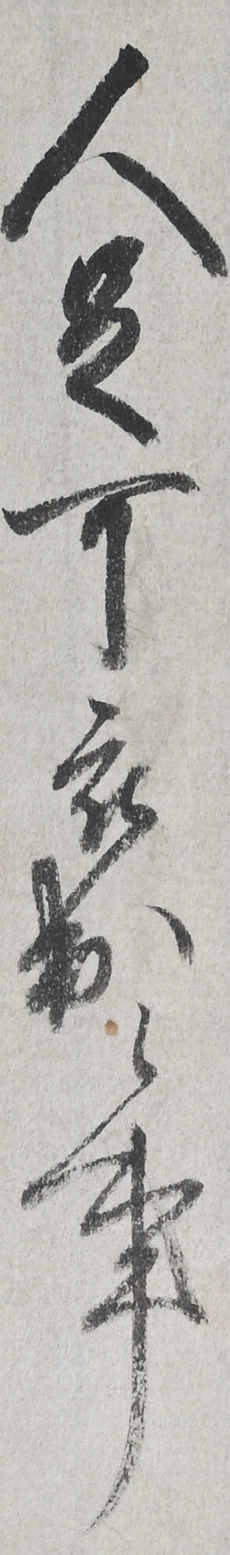人足可被出候事
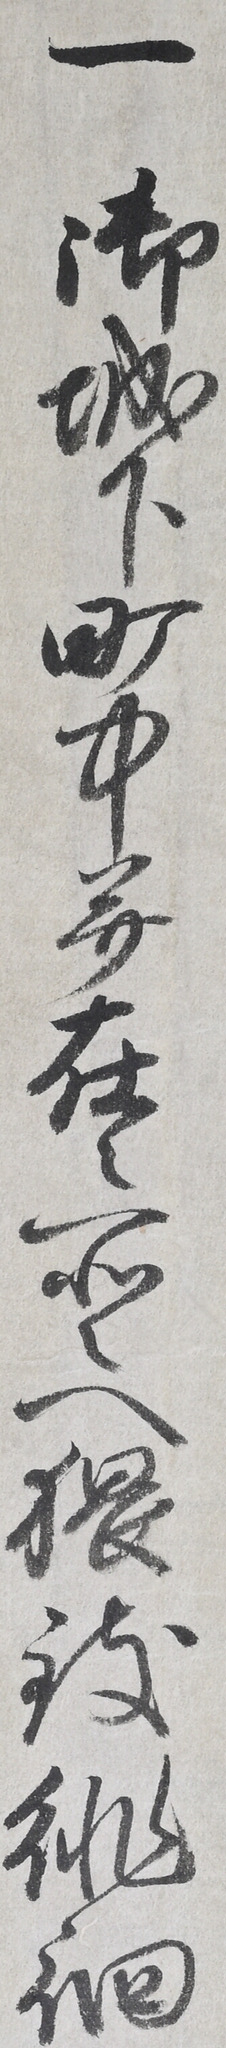一御城下町中幷在々所々へ猥致徘徊
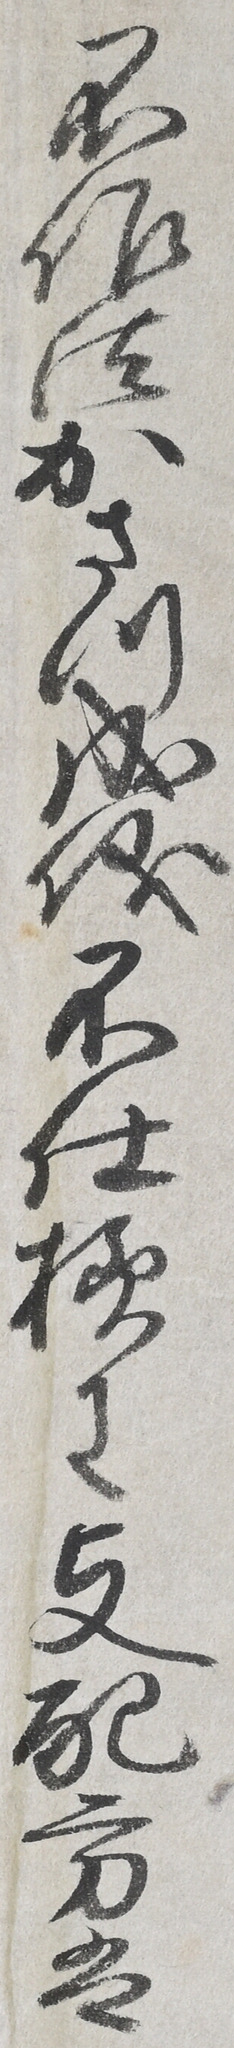不作法かさつ成儀不仕様に支配方は
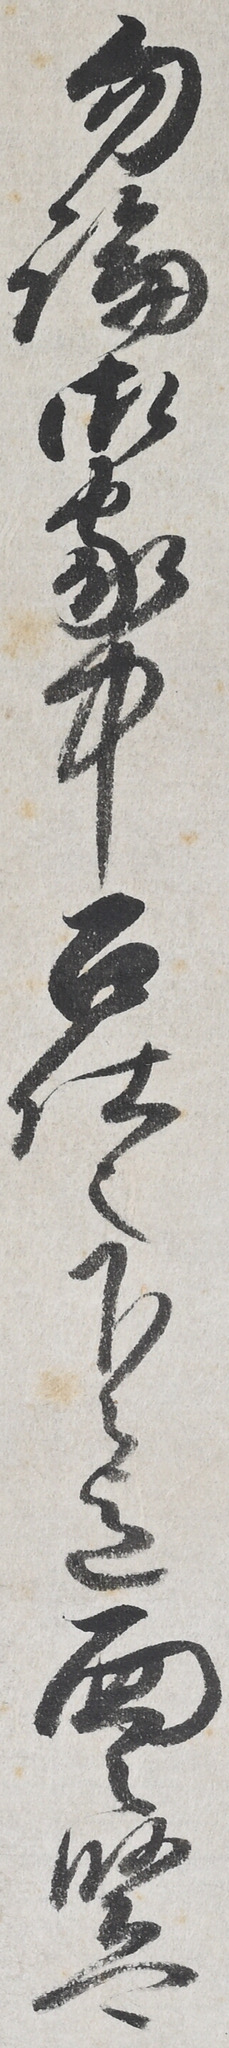勿論御家中召仕之下々迄面々堅可
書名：覚
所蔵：伊那市立高遠町図書館・合同会社AMANE
